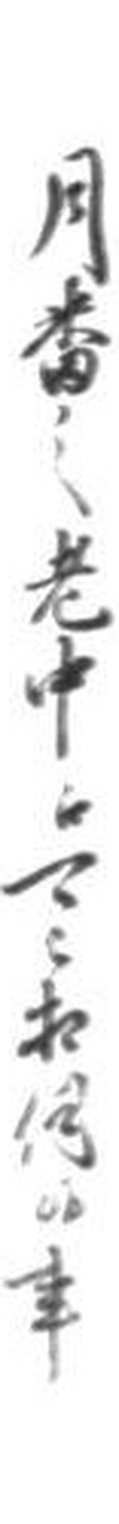月番之老中江可被相伺候事

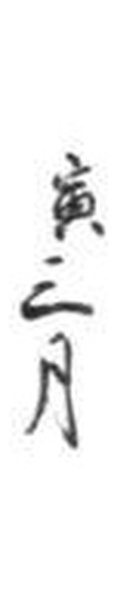寅三月
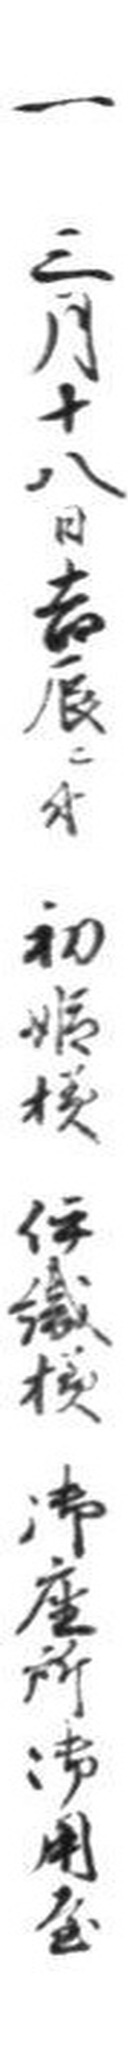一三月十八日吉辰ニ付初姫様伊織様御座所御用屋
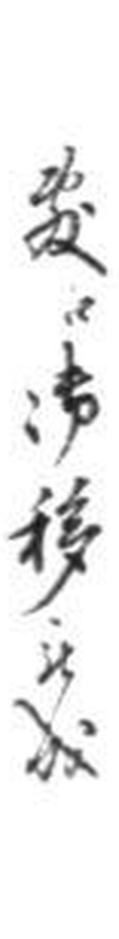敷江御移被成
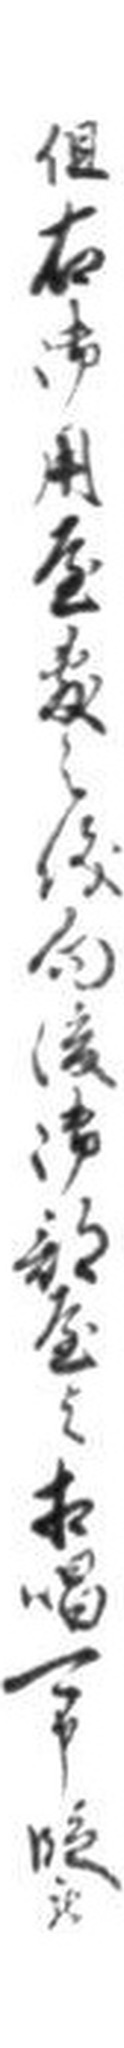但右御用屋敷之儀向後御部屋与相唱可申段被
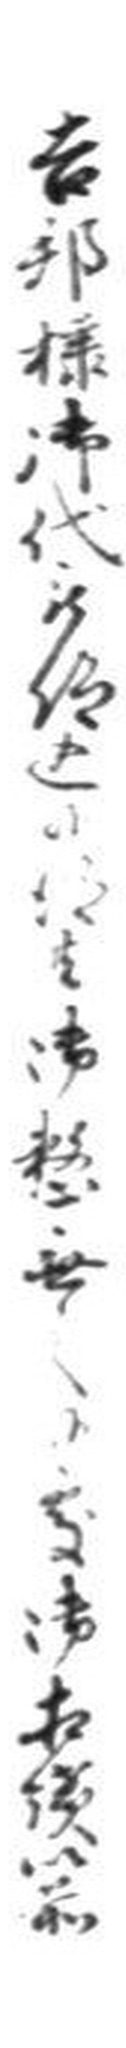吉邦様御代被仰込候得共御整無之候処御相続以前
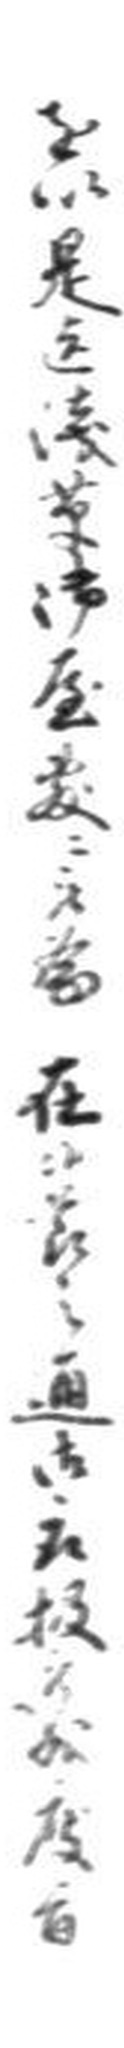を以是迄浅草御屋敷ニ被為在候節之通御取扱被成度旨
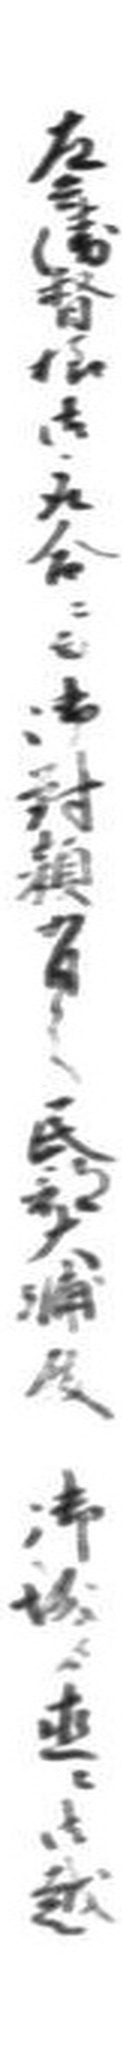左兵衛督様御取合ニ而御対頼有之民部大輔殿御城ゟ直ニ御越
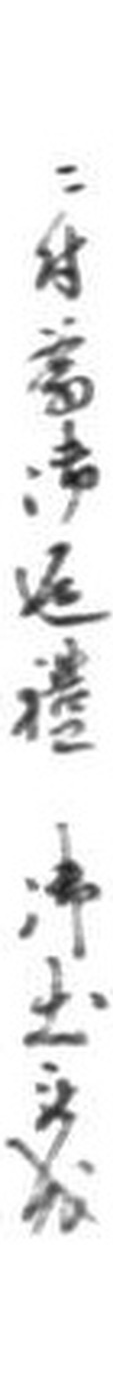ニ付為御返礼御出被成
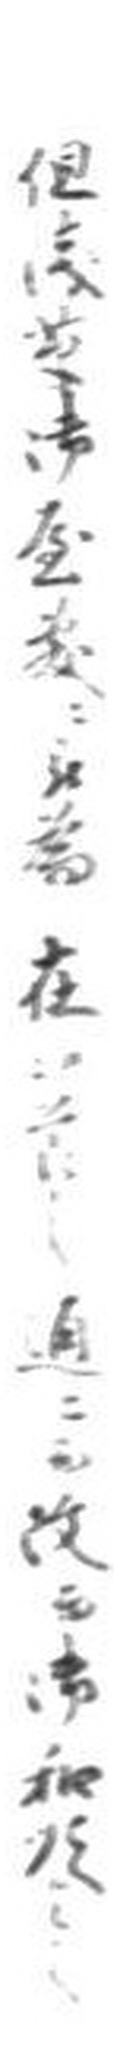但浅草御屋敷ニ被為在候節之通ニ而改而御和順之
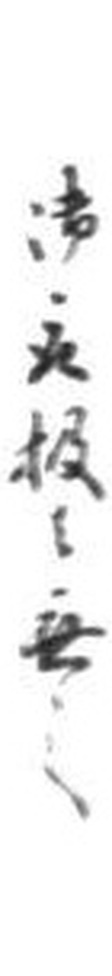御取扱者無之

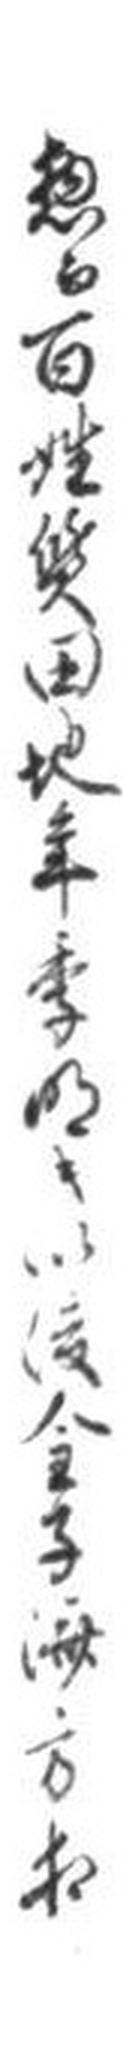惣而百姓質田地年季明キ以後金子済方相
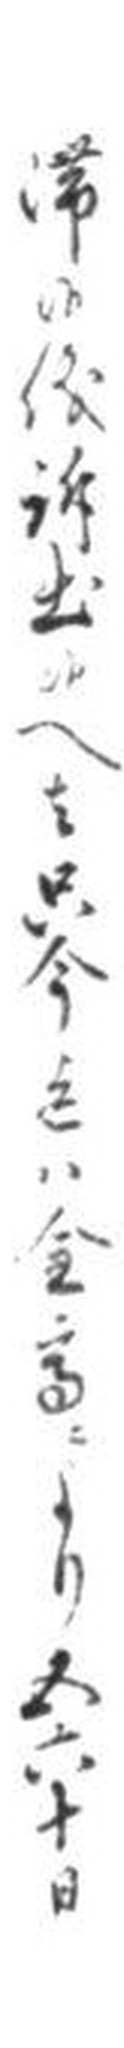滞候儀訴出候へ者只今迄ハ金高ニより五六十日
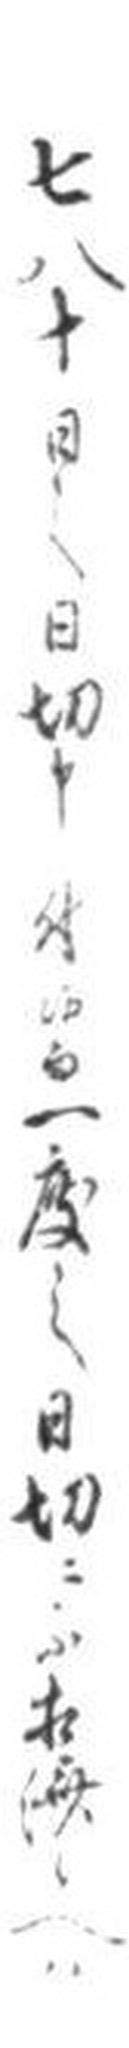七八十日之日切申付候而一度之日切ニ不相済候ヘハ
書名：家譜 三十五 宗昌公 従享保六年到同七年
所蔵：福井県文書館 Fukui Prefectural Archives
